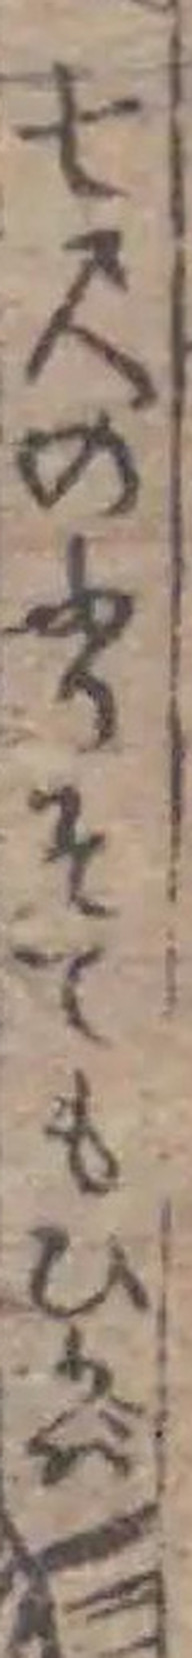七尺のふりそてもひかば
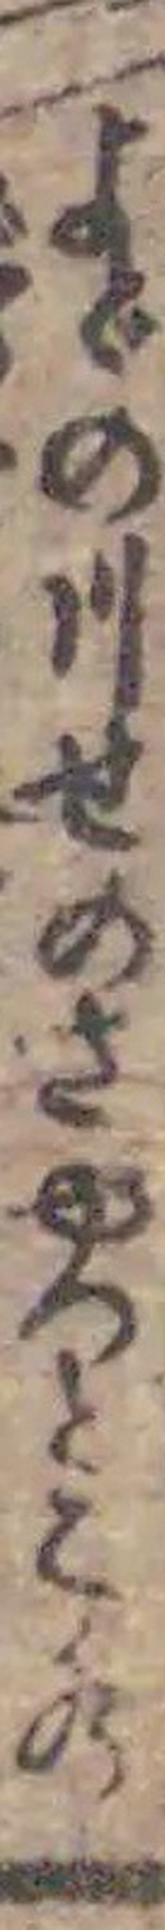よどの川せのさやつとこ水
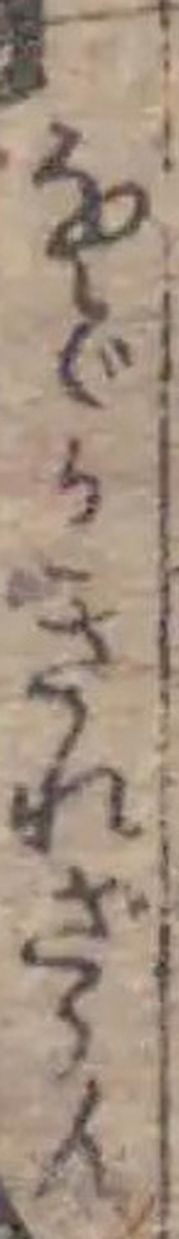などかきれざらん
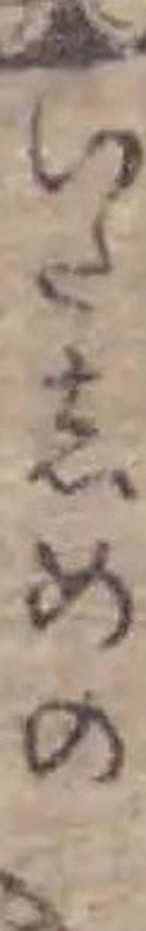いたしめの
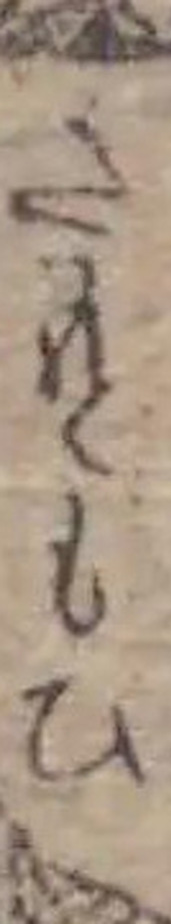たもともひ
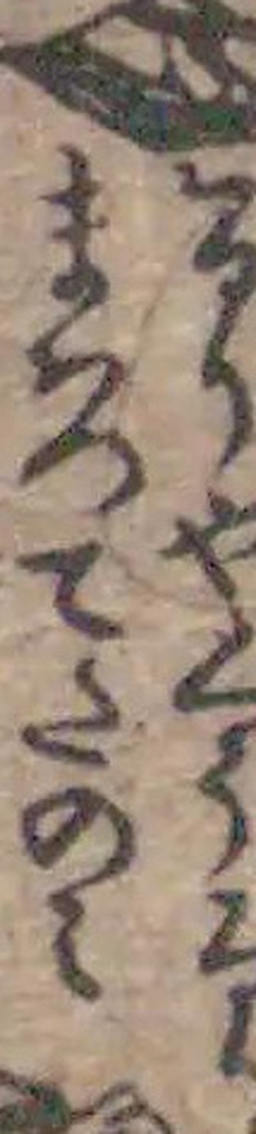まはつてたのみ
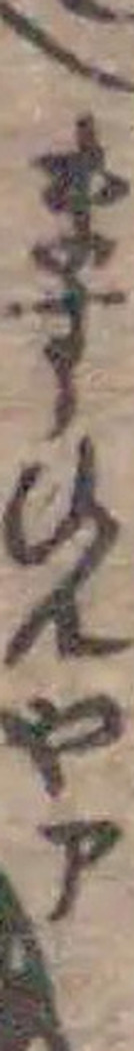ますひんやア
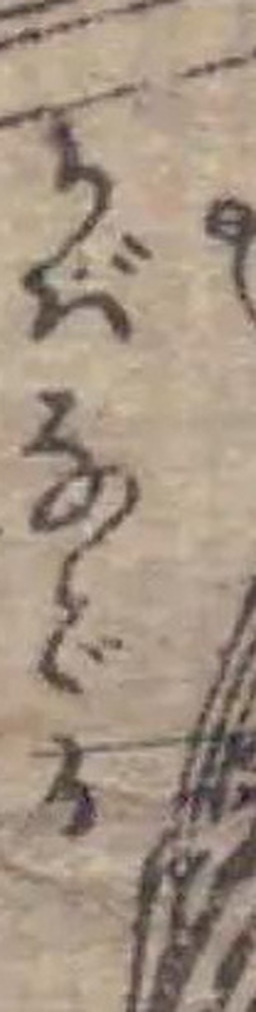かばなどか
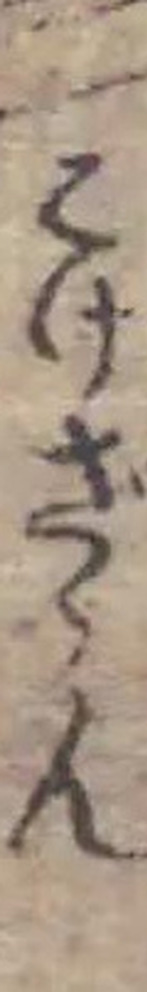こけざらん
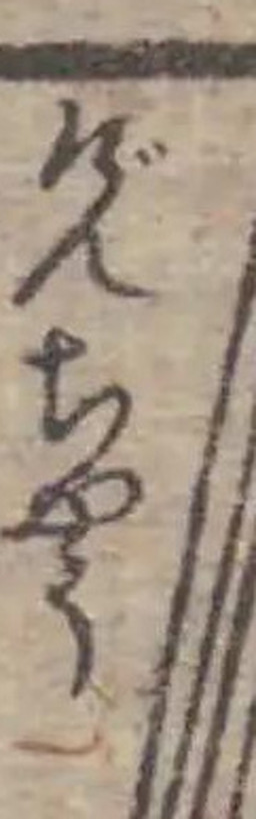げんちやう
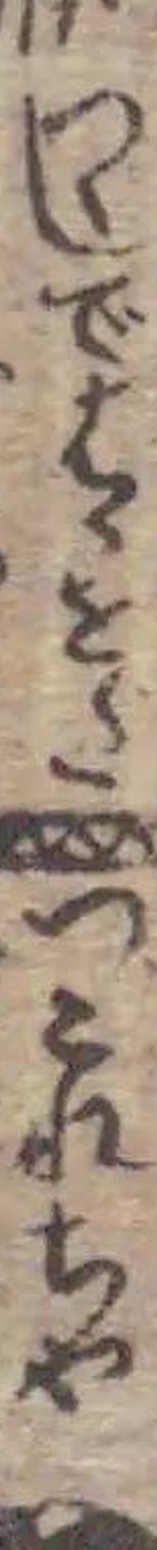つくしではゝをたつこれちや
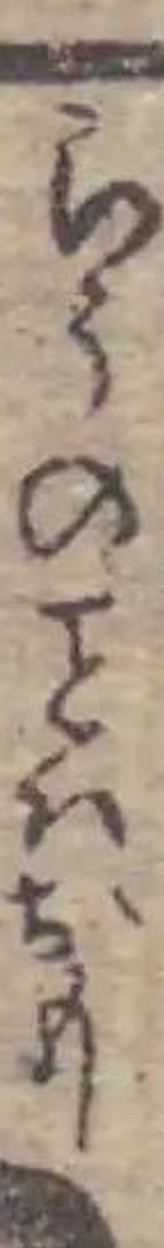らうのことはおもし
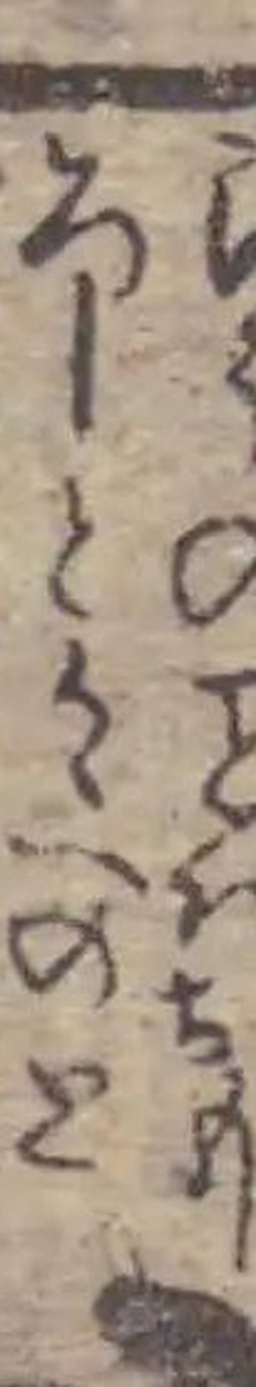ろしとかゝへのと
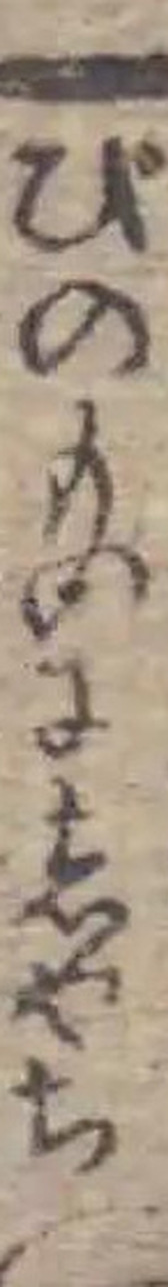びのものにしやち
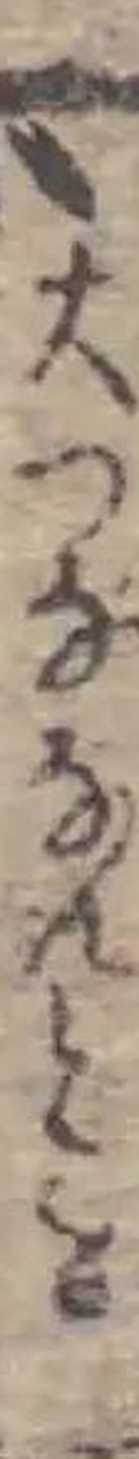大つななんとを
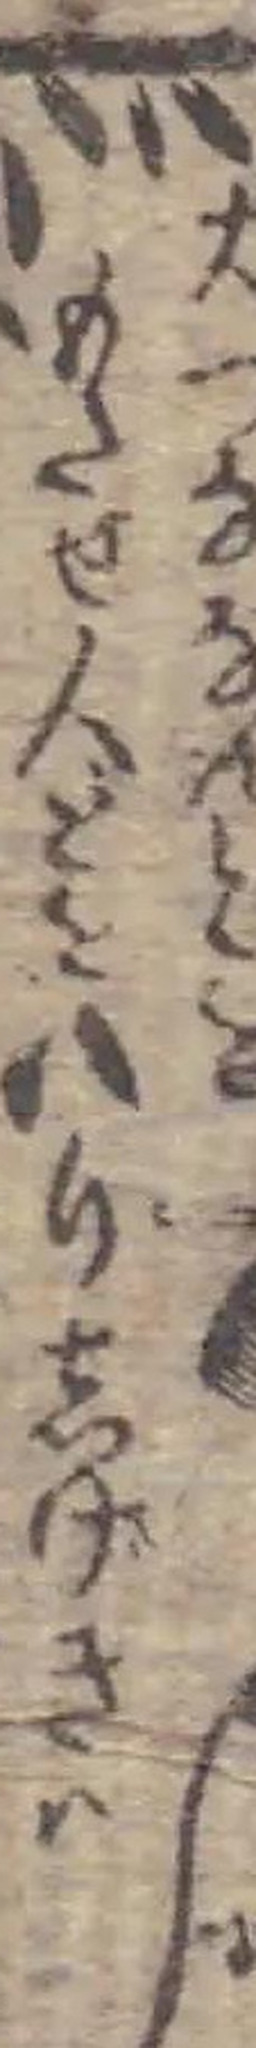もたせ人どをりしげきは
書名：色男其処此処 3巻
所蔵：国立国会図書館 National Diet Library, JAPAN
